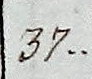37
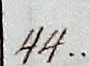44
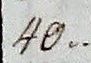40
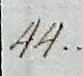44
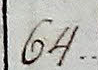64
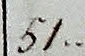51
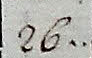26
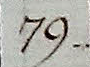79
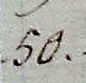50
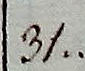31
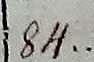84
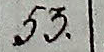53.
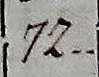72
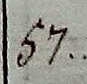57
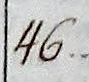46
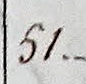51
